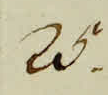25
